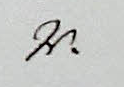2.
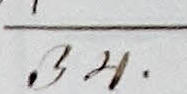34.
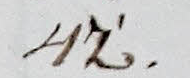42.
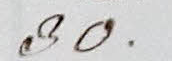30.
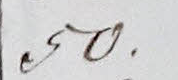50.
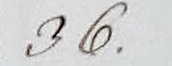36.
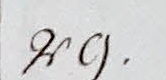29.
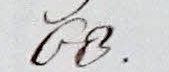63.
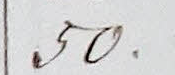50.
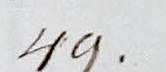49.
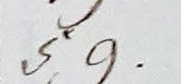59.
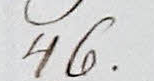46.
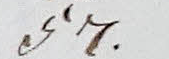57.
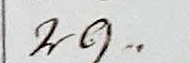29.
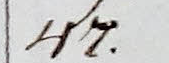47.
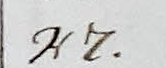27.
